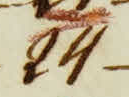24
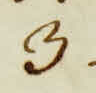3
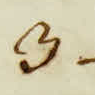3
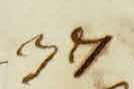37
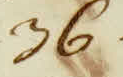36
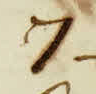7
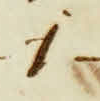1
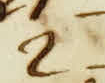2
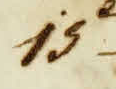15
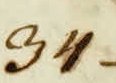34
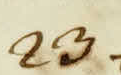23
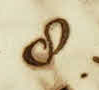8
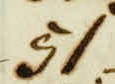51
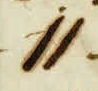11
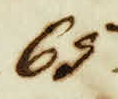65
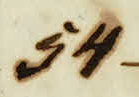54
